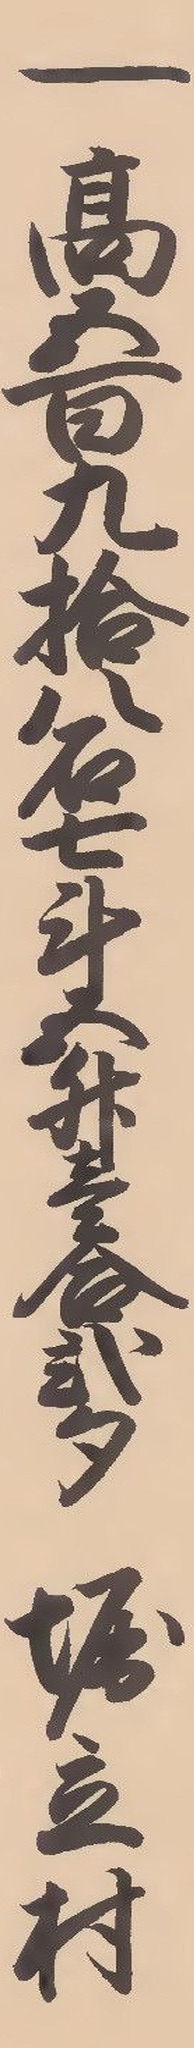一髙五百九拾八石七斗五升壱合弐夕堀立村
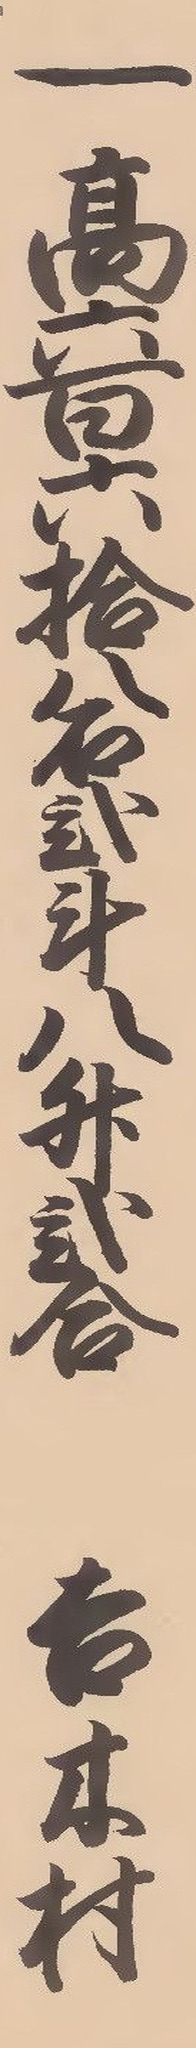一髙六百六拾八石弐斗八升弐合吉木村
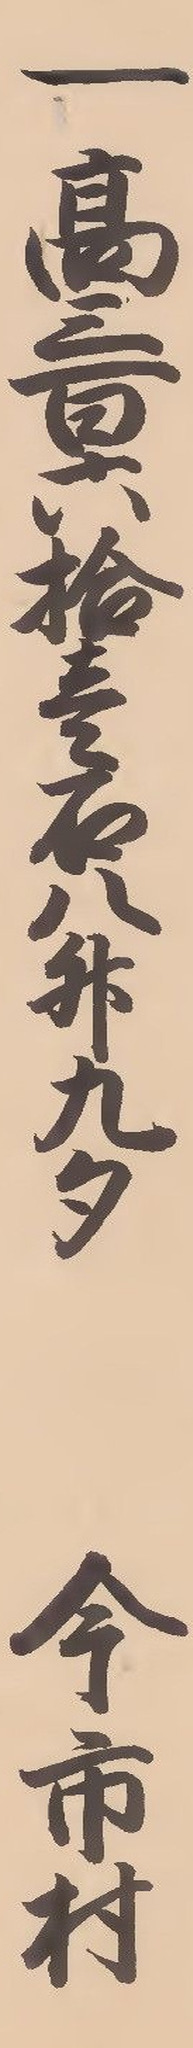一髙三百六拾壱石八斗九夕今市村
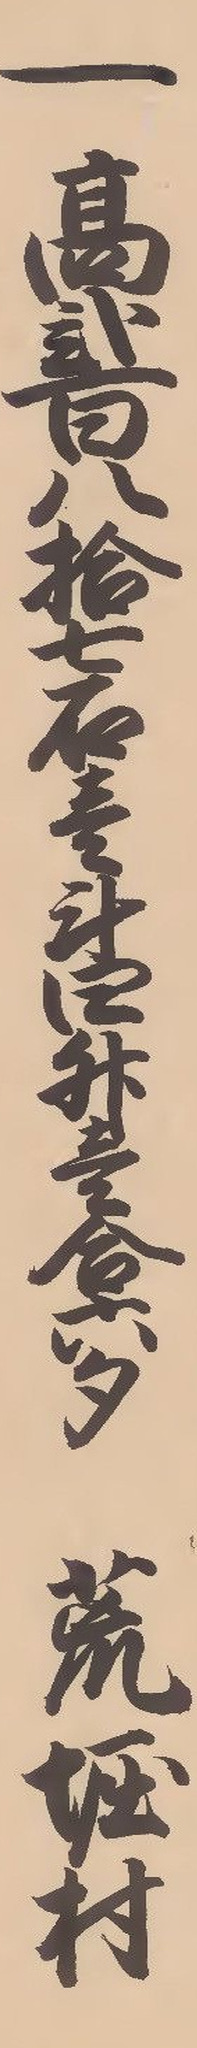一髙弐百八拾七石壱斗四升壱合六夕荒堀村
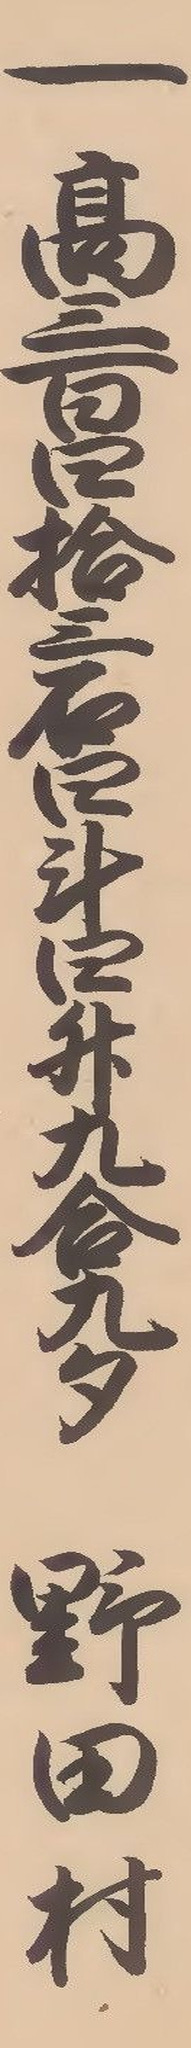一髙三百四拾三石四斗四升九合九夕野田村
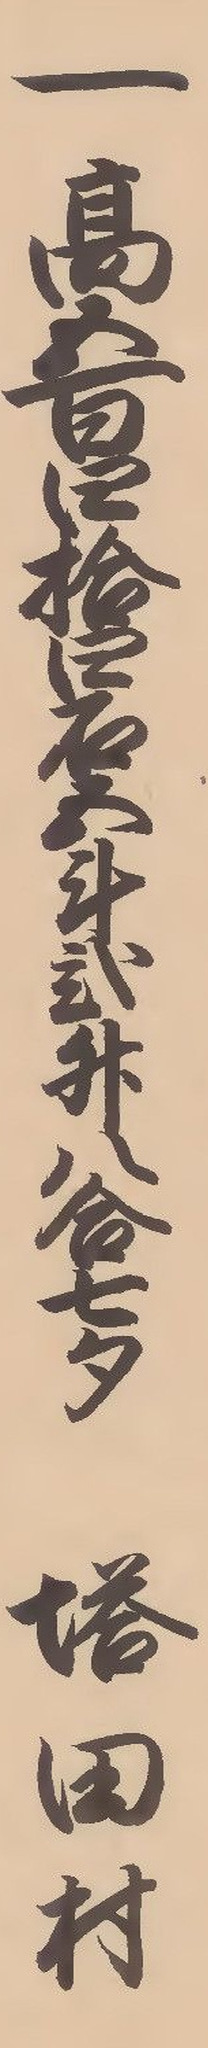一髙五百四拾四石五斗弐升八合七夕塔田村
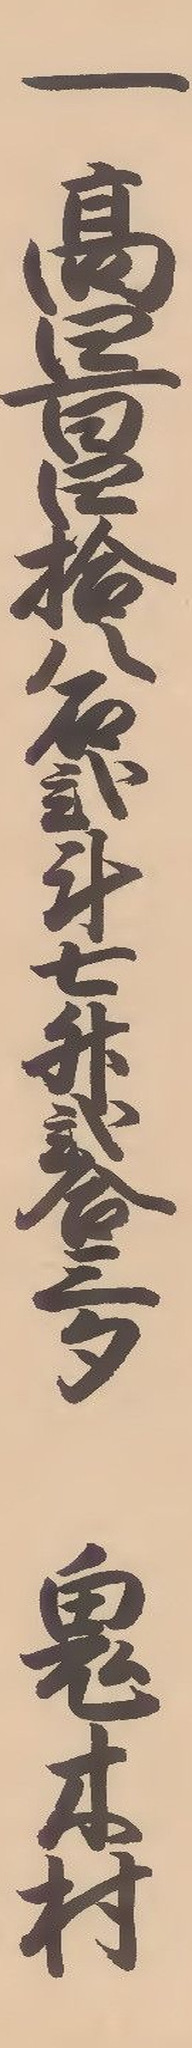一髙四百四拾八石弐斗七升弐合三夕鬼木村

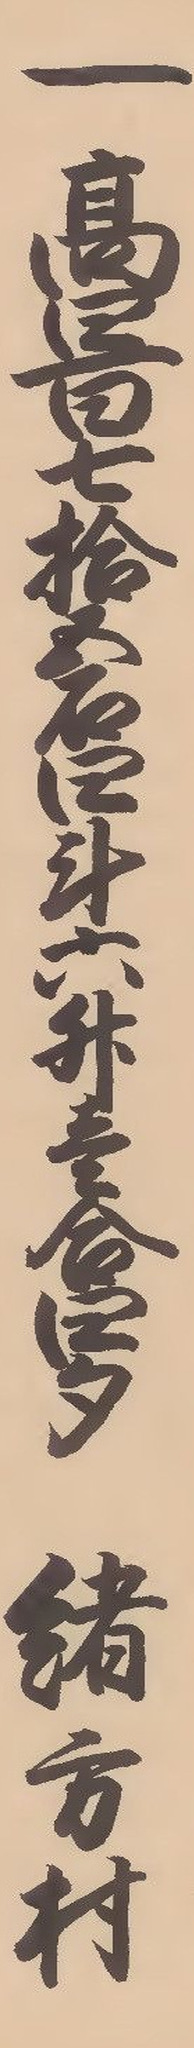一髙四百七拾五石四斗六升壱合四夕緒方村
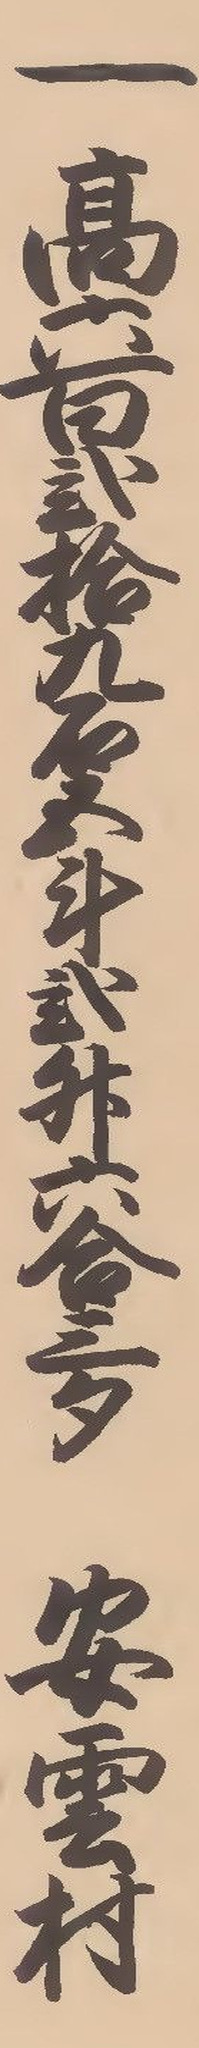一髙六百弐拾九石五斗弐升六合三夕安雲村
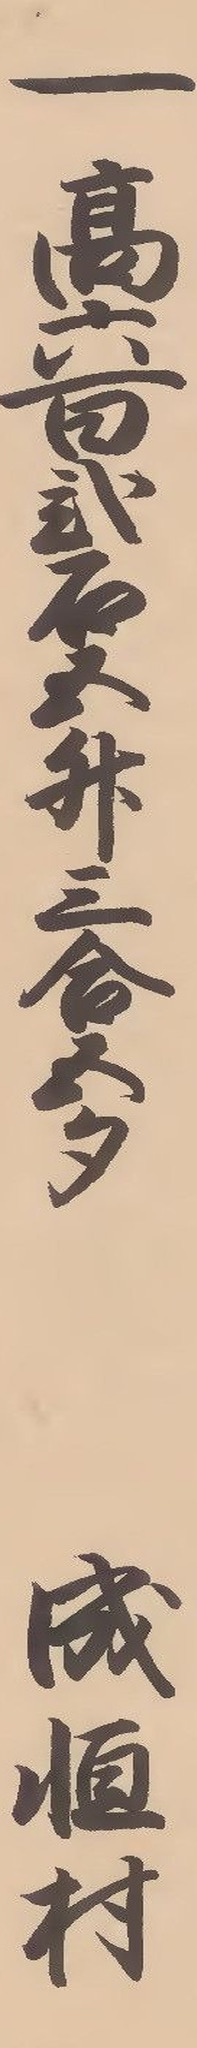一髙六百弐石五升三合五夕成恒村
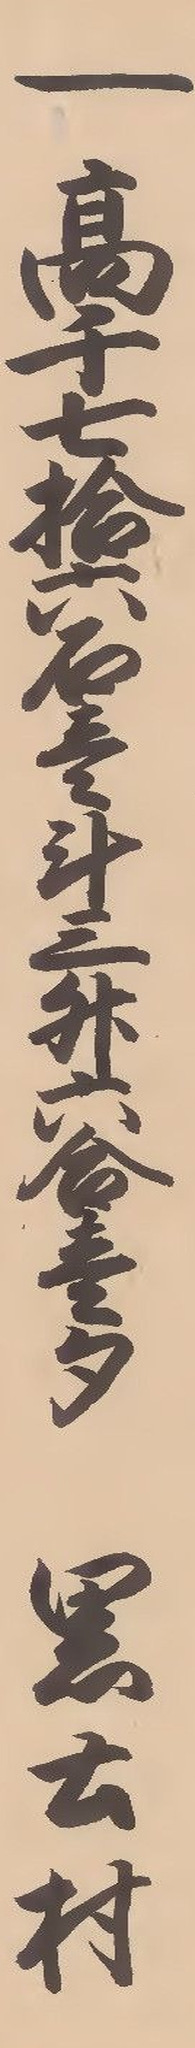一髙千七拾六石壱斗三升六合壱夕黑土村
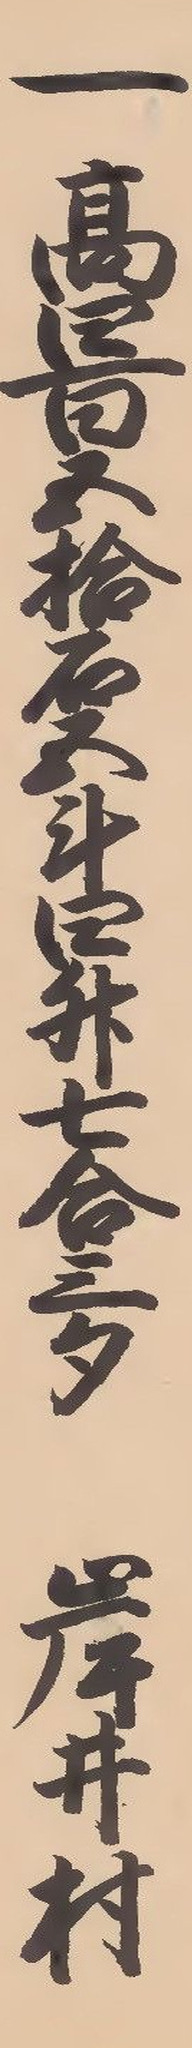一高四百五拾石五斗四升七合三夕岸井村
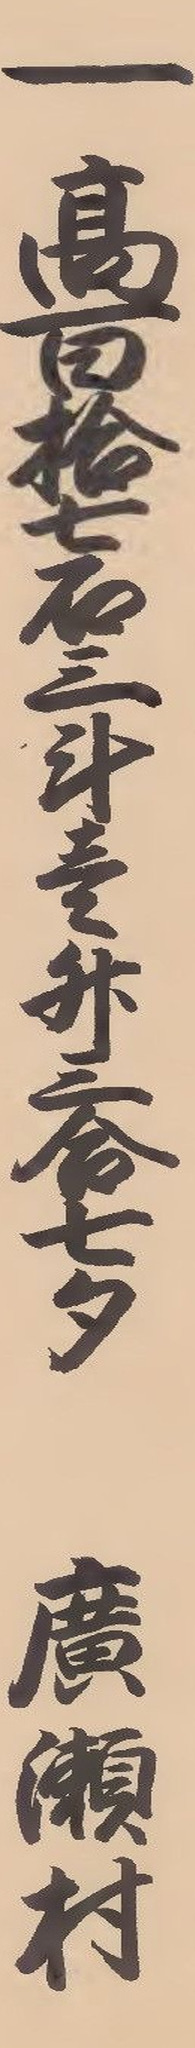一髙百拾七石三斗壱升三合七夕廣瀬村
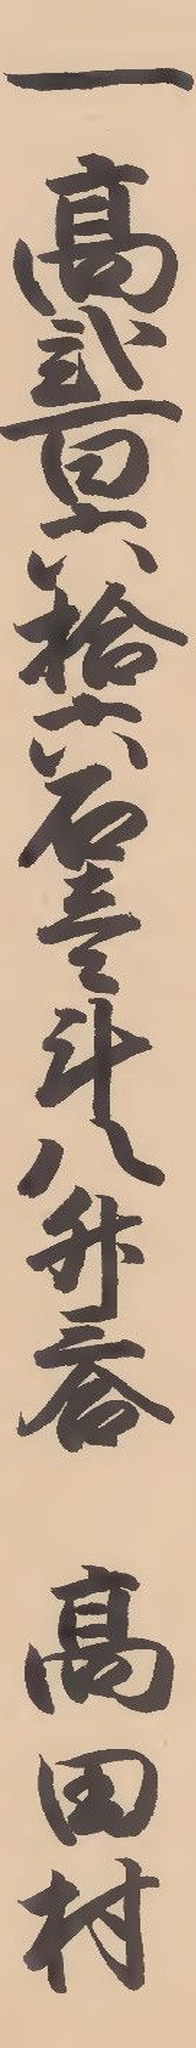一髙弐百六拾六石壱斗八升三合髙田村
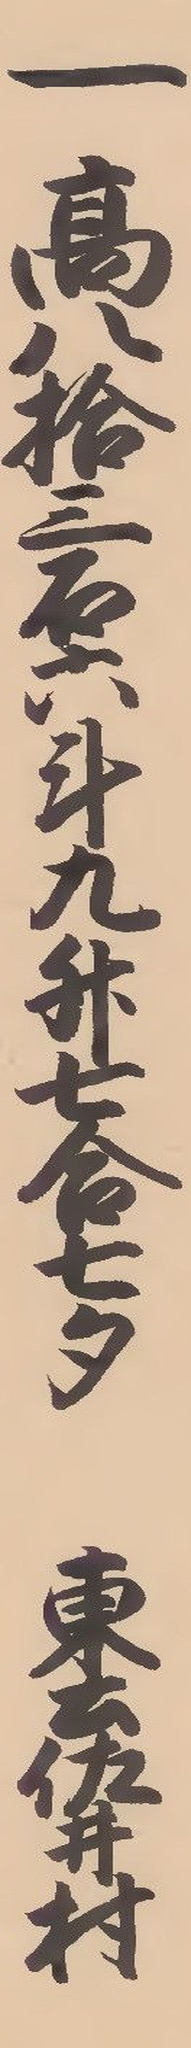一髙八拾三石六斗九升七合七夕東土佐井村

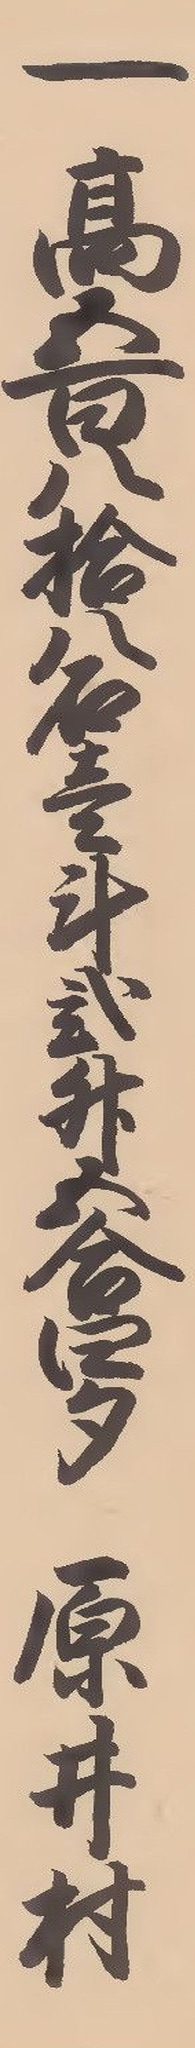一髙五百八拾八石壱斗弐升五合四夕原井村
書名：豊前国郷帳
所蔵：国立公文書館 National Archives of Japan
